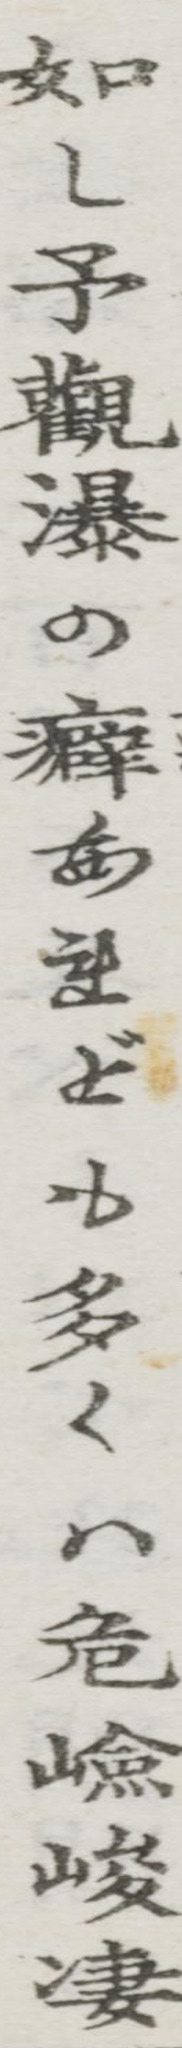如し予観瀑の癖あれども多くは危嶮峻淒
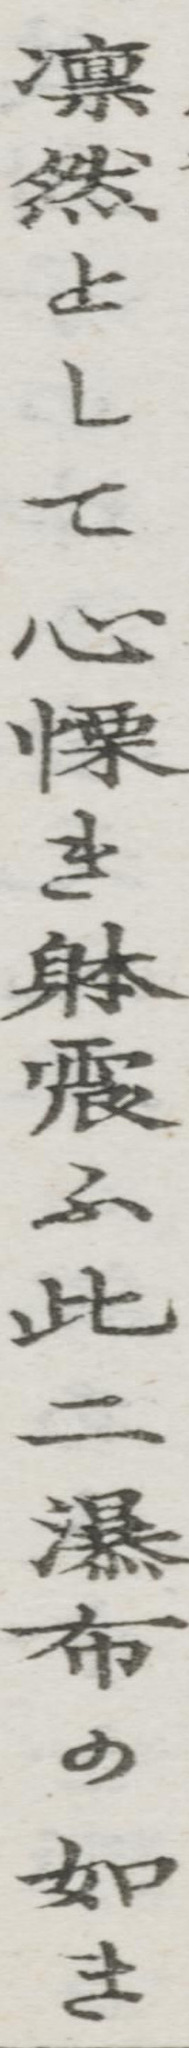凛然として心慄き躰震ふ此二瀑布の如き
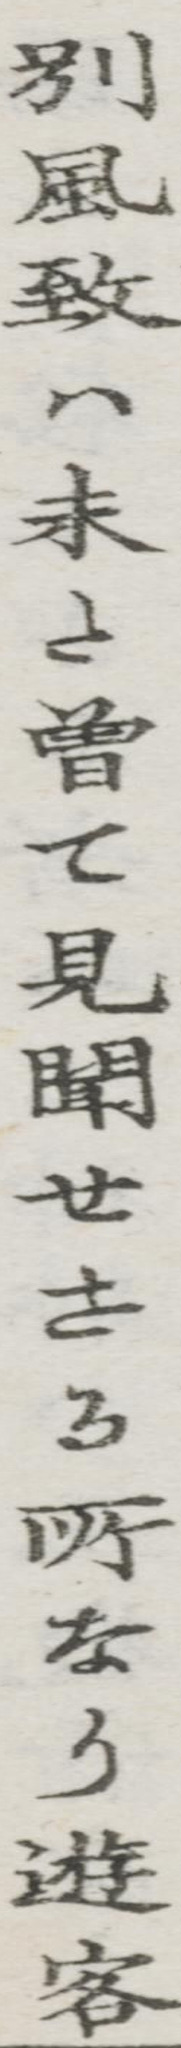別風致は未た曾て見聞せさる所なり遊客
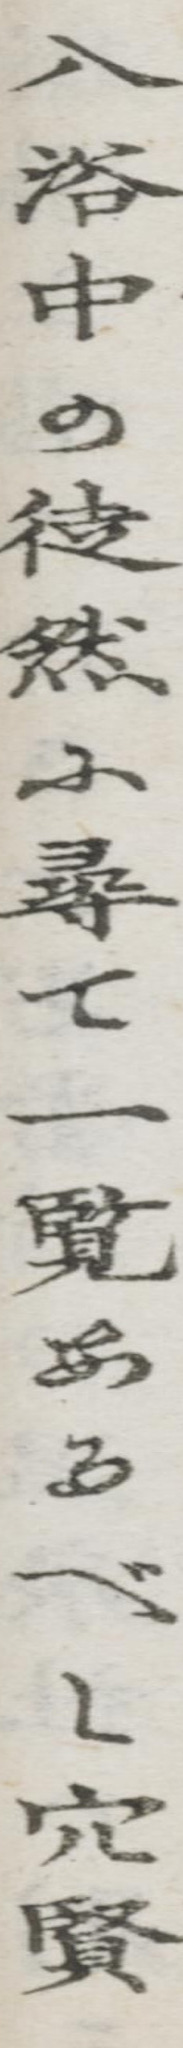入浴中の徒然に尋て一覧あるべし穴賢
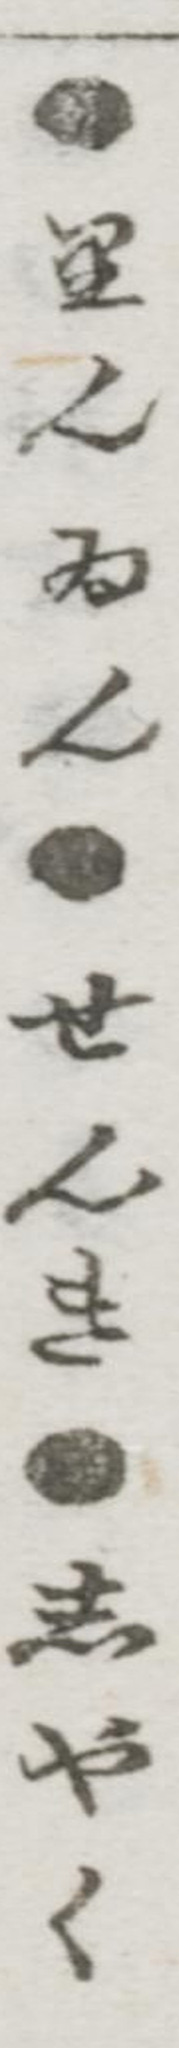●りんゐん●せんき●しやく
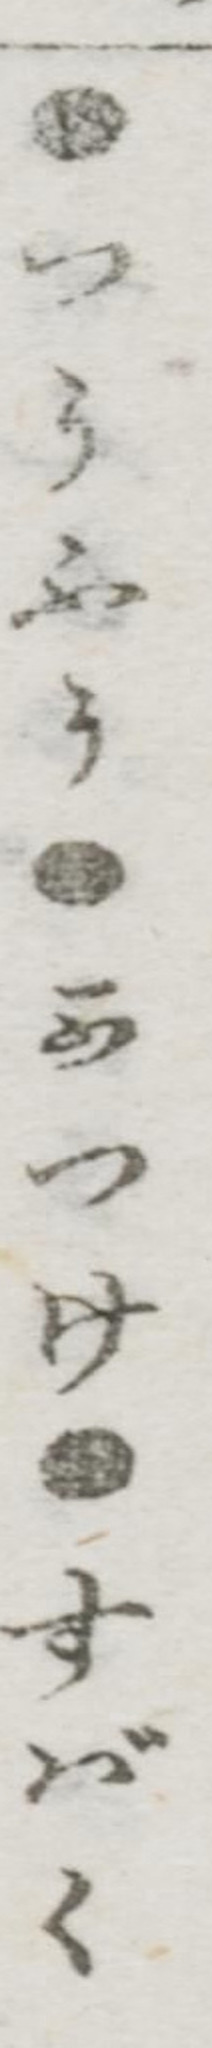●つうふう●かつけ●すばく
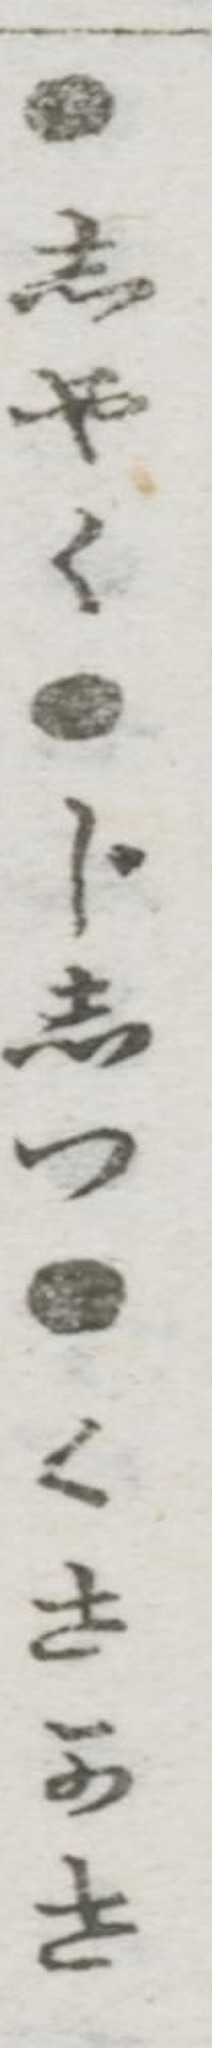●しやく●じしつ●くさかさ
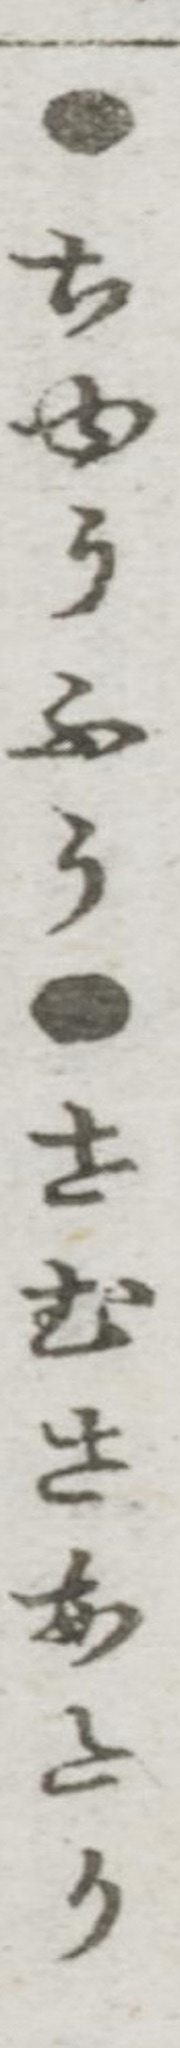●ちゆうふう●さむさあたり
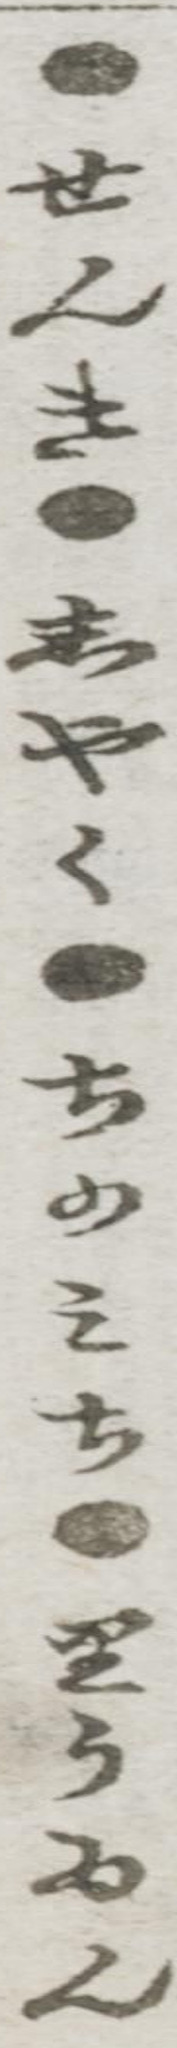同躶湯●せんき●しやく●ちのみち●りうゐん
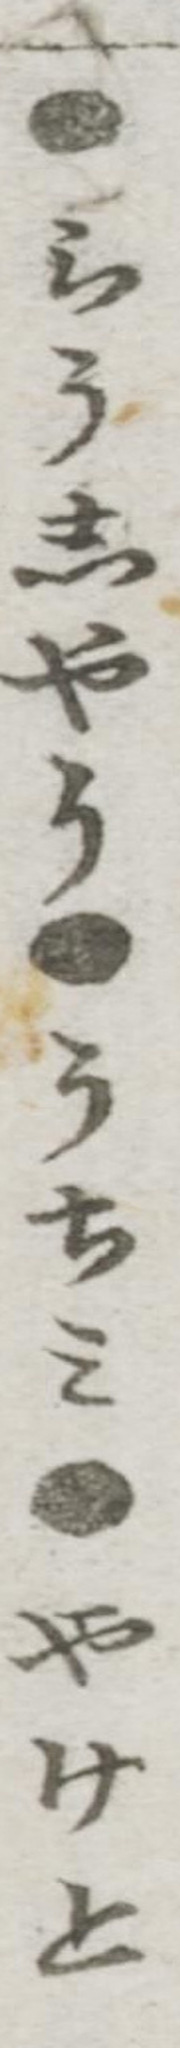●らうしやう●うちみ●やけと

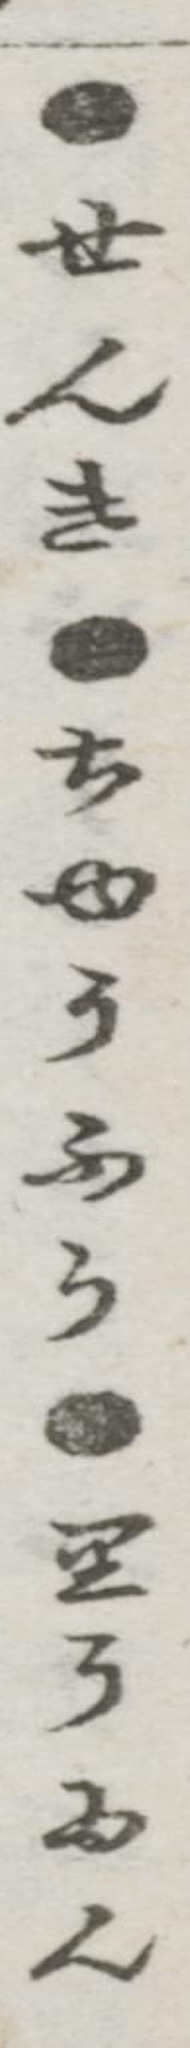塩竈坂下湯●せんき●ちゆうふう●りうゐん
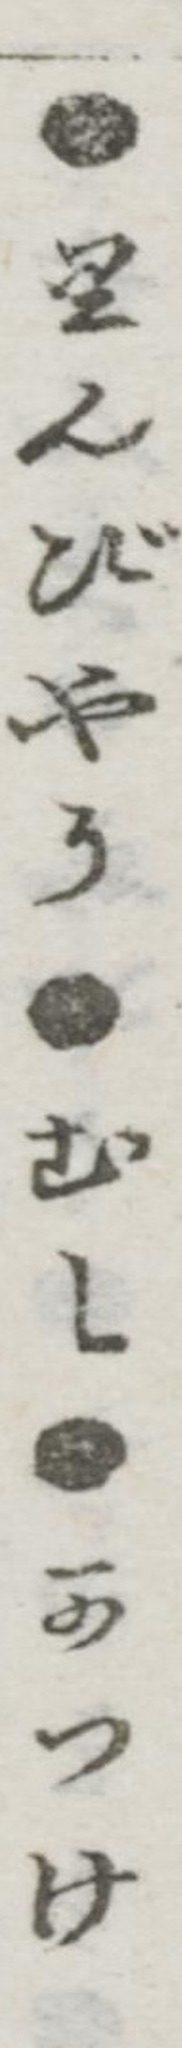●りんびやう●むし●かつけ
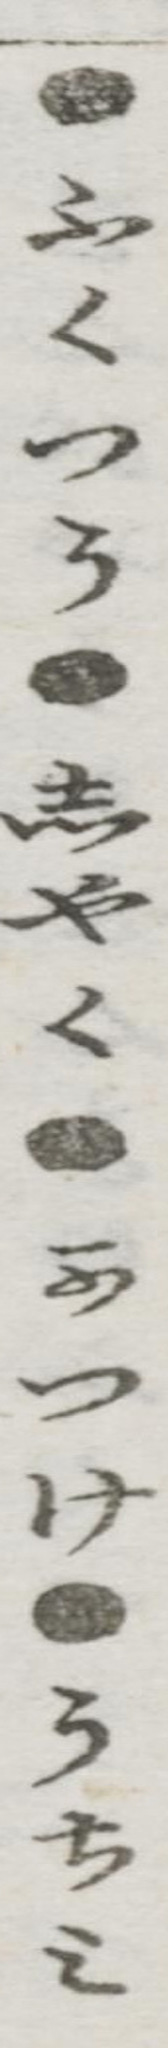●ふくつう●しやく●かつけ●うちみ
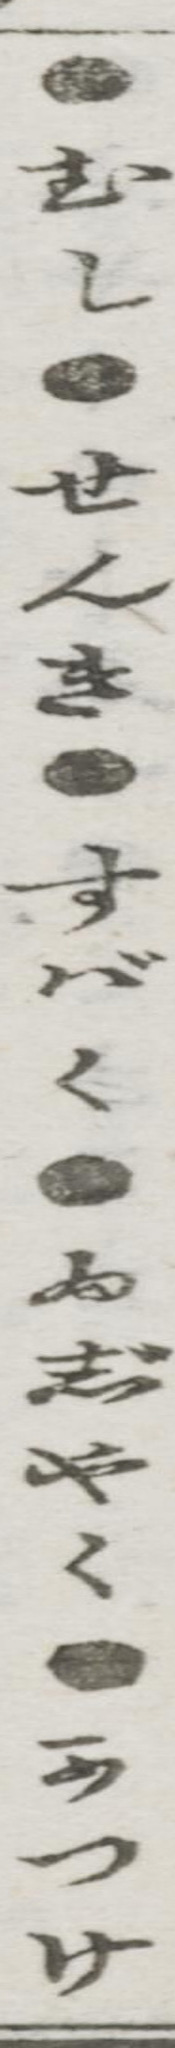同医王湯●むし●せんき●すばく●ゐじやく●かつけ
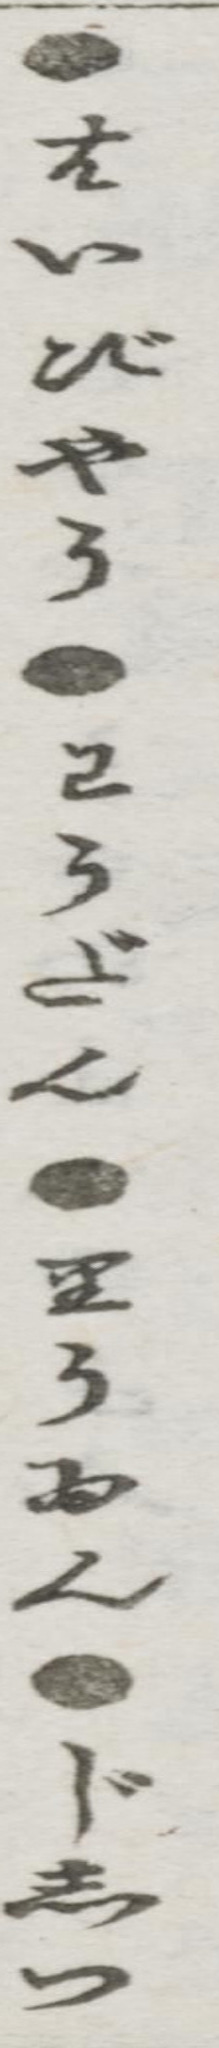●はいびやう●わうだん●りうゐん●じしつ
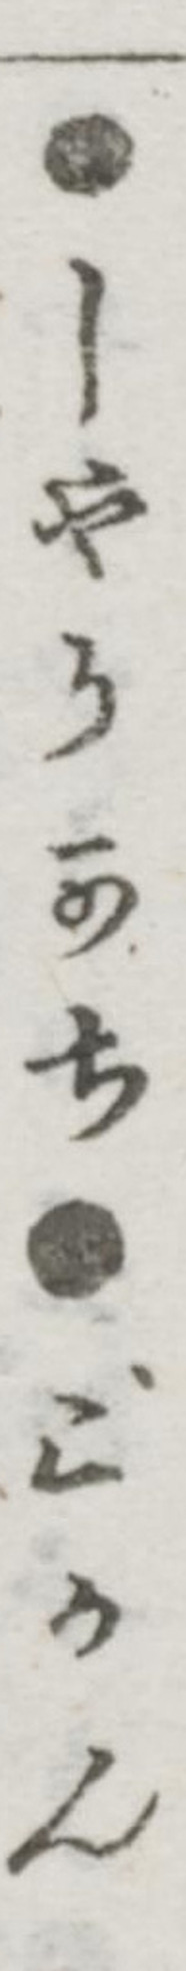●しやうかち●こかん
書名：塩原繁昌記　全
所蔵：東京大学地震研究所図書室 Earthquake Research Institute Library, The University of Tokyo, JAPAN
